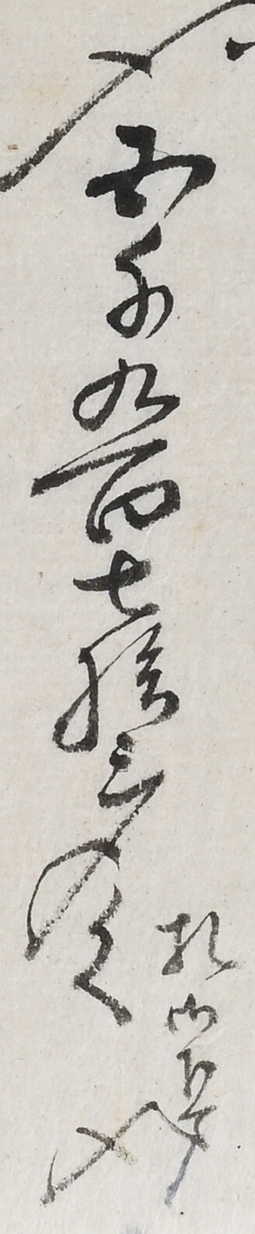〆五千九百七拾三〆文〆
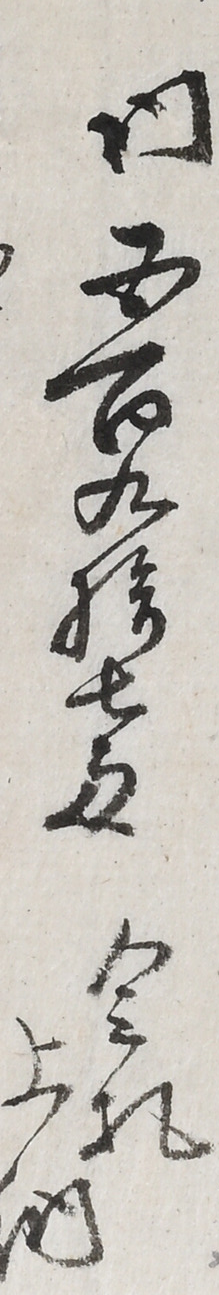内五百九拾七両金札
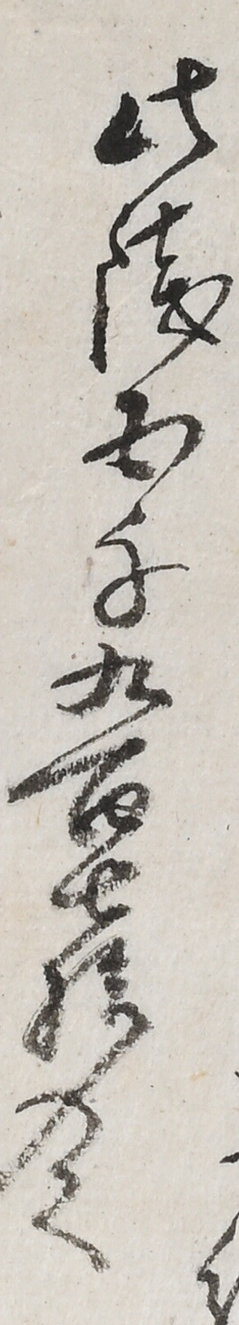此銭五千九百七拾〆文
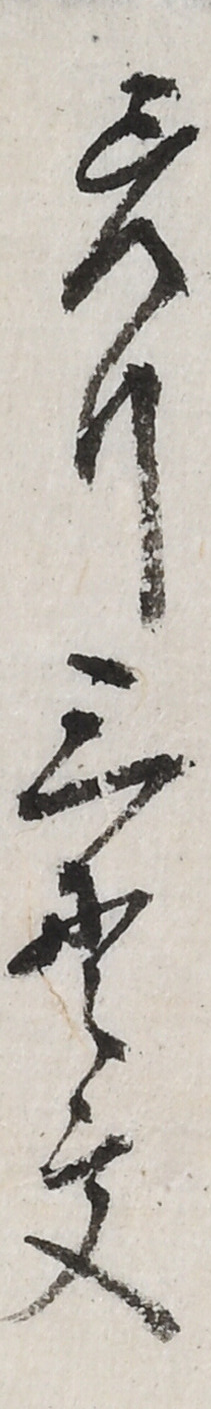差引三貫文
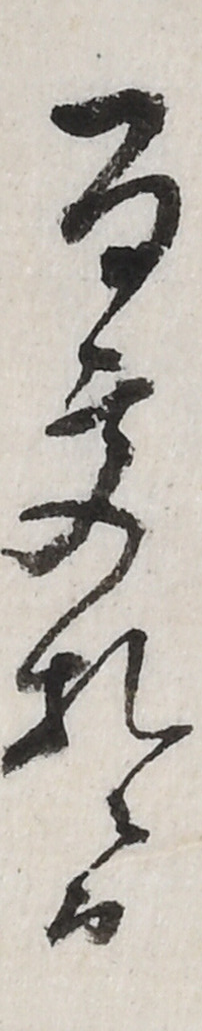百文札ニ而
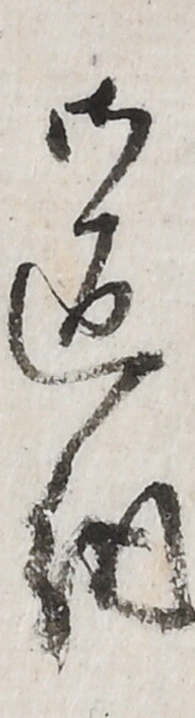御返納
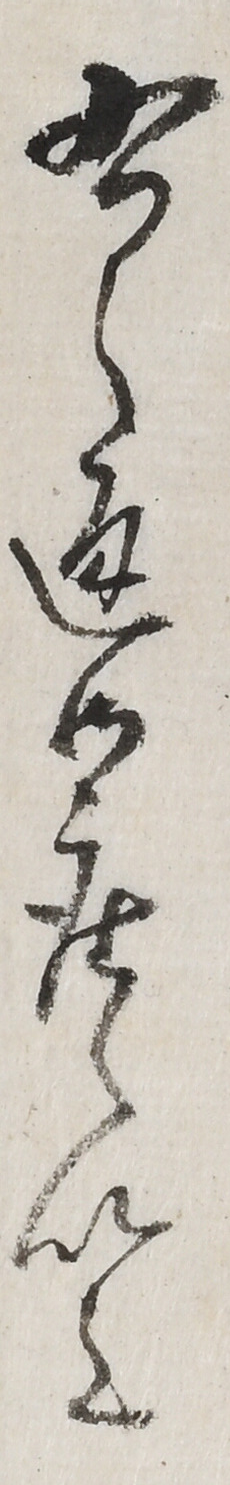右之通御座候以上
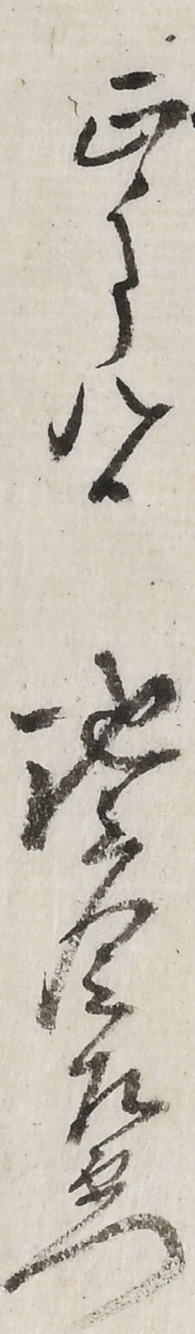正月八日池上金左衛門
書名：信濃全國楮幣引換御用控
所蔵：伊那市立高遠町図書館・合同会社AMANE
